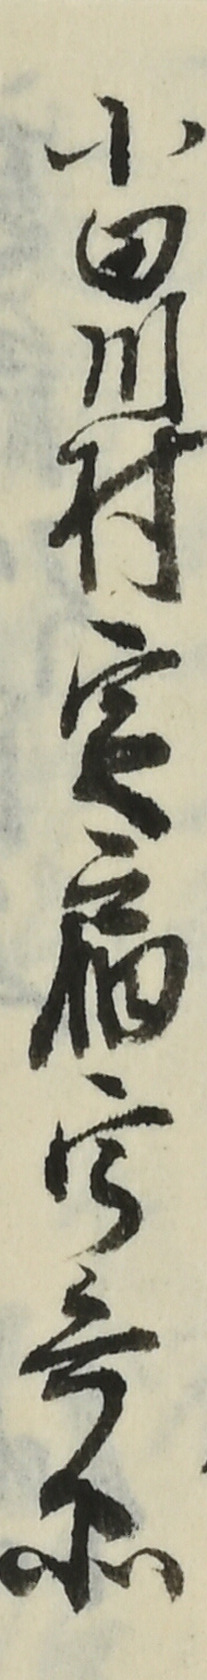逸見小田川村宿宇兵衛

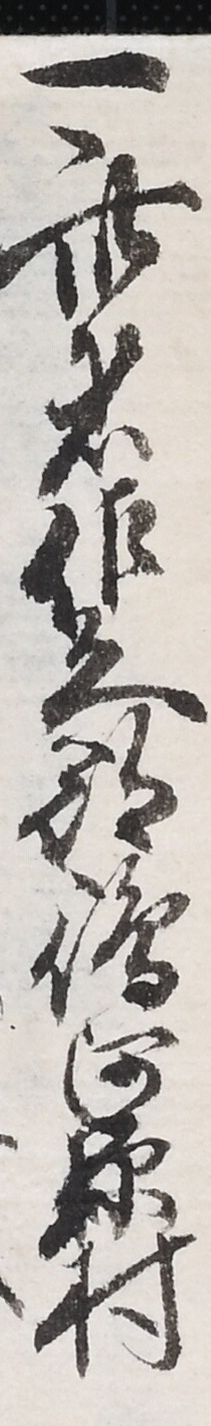一此者佐久郡島河原村
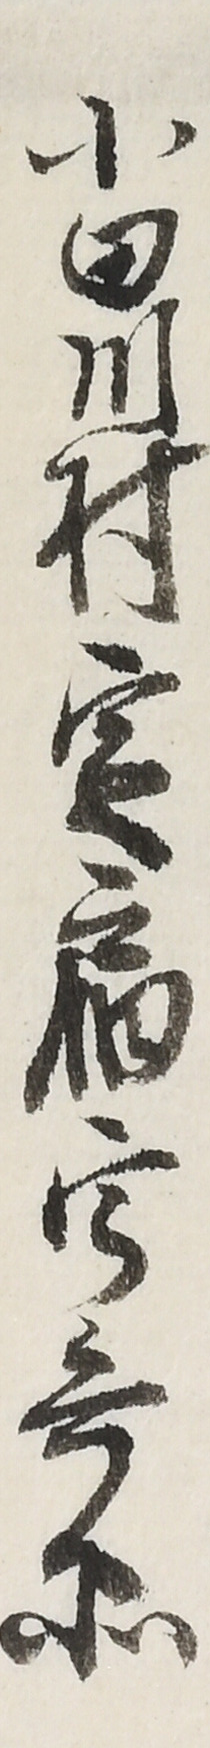小田川村定宿宇兵衛
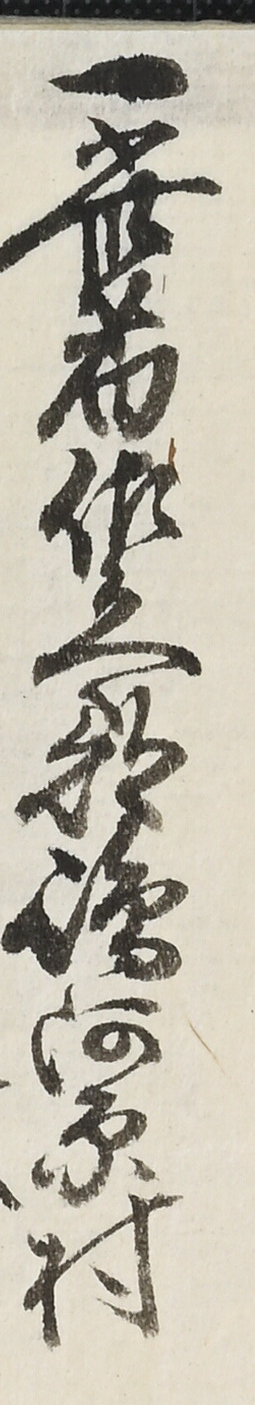一此者佐久郡島河原村
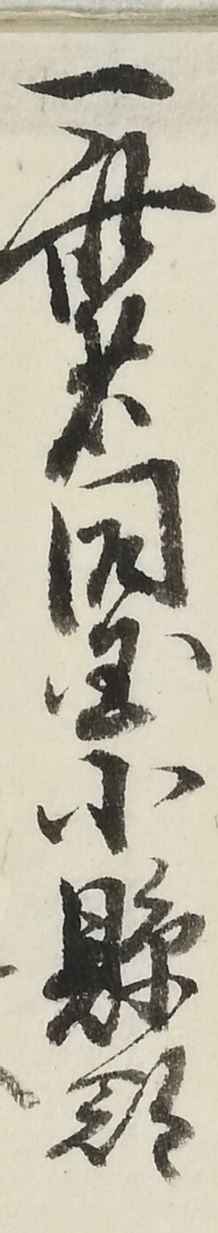一此者同国小県郡

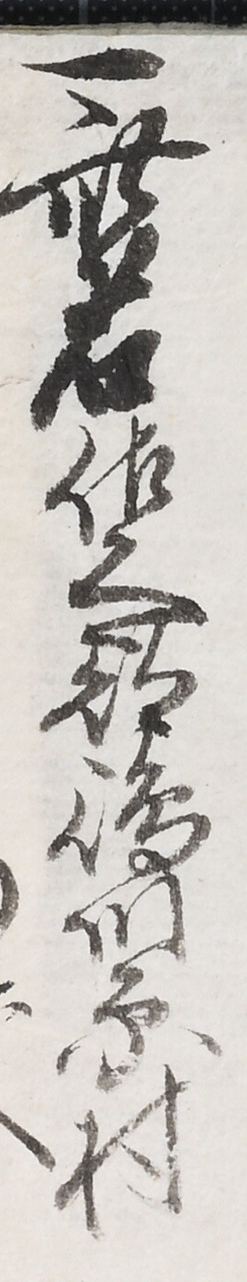一此者佐久郡島川原村
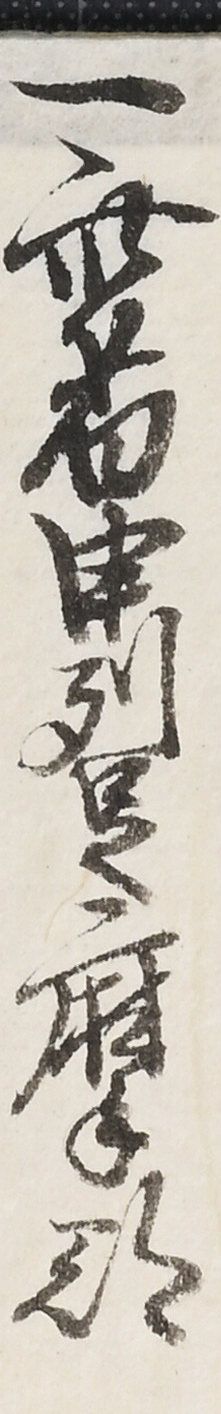一此者甲州巨摩郡
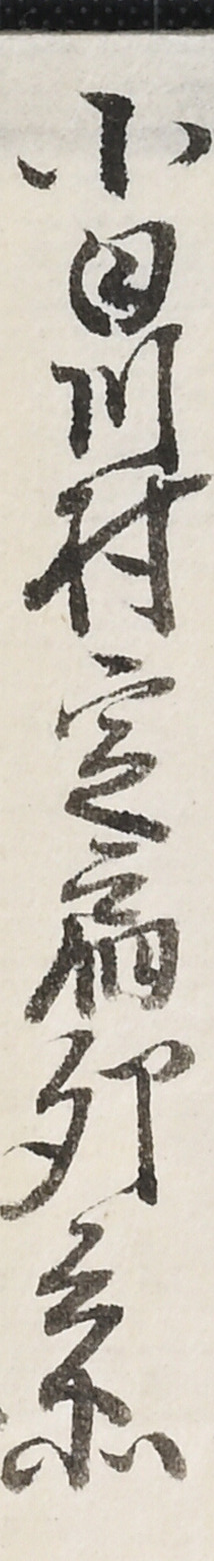小田川村定宿卯兵衛
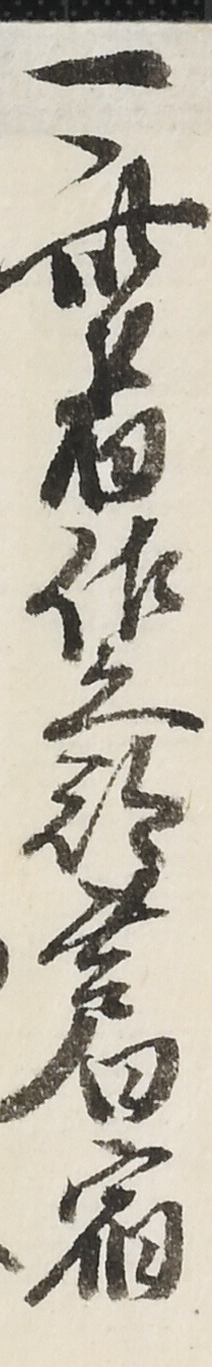一此者佐久郡芦田宿
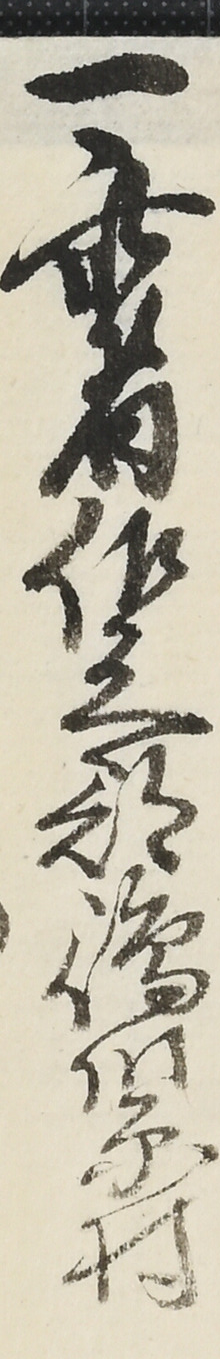一此者佐久郡島川原村
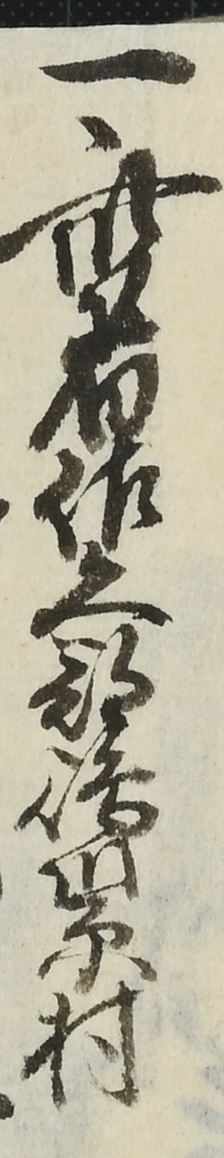一此者佐久郡島川原村
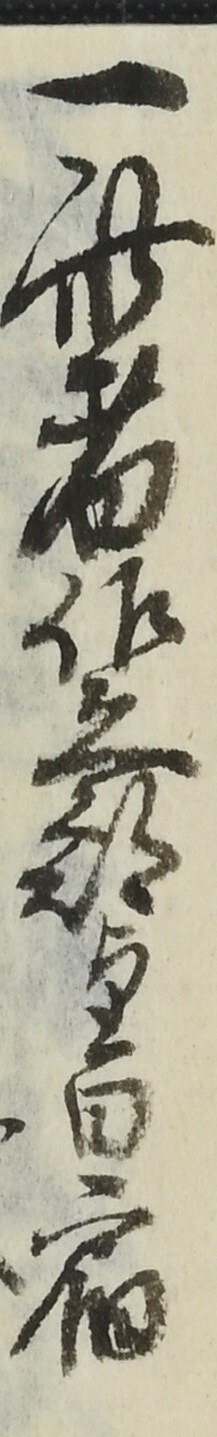一此者佐久郡芦田宿

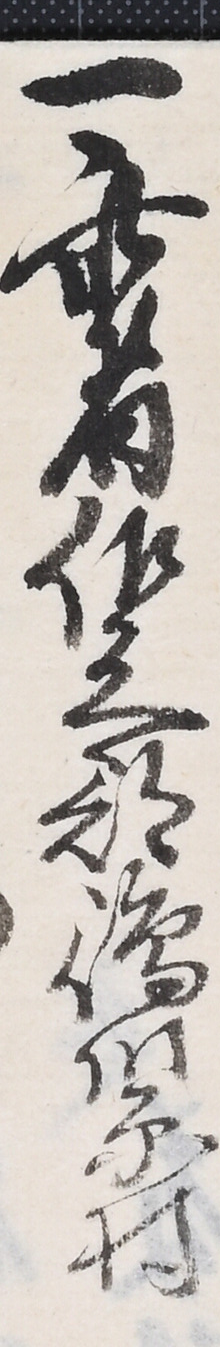一此者佐久郡島川原村
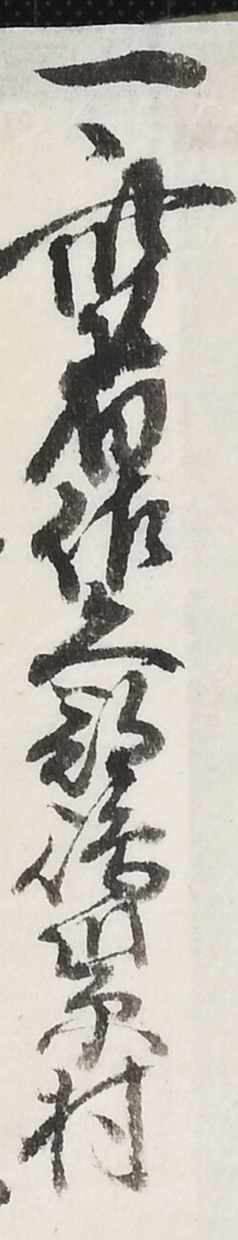一此者佐久郡島川原村
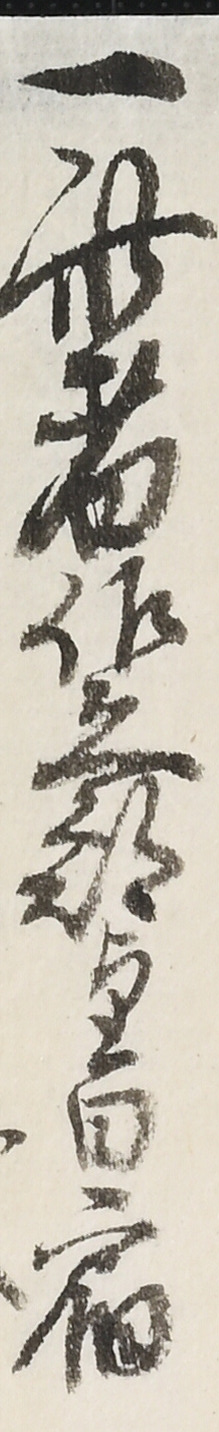一此者佐久郡望月宿
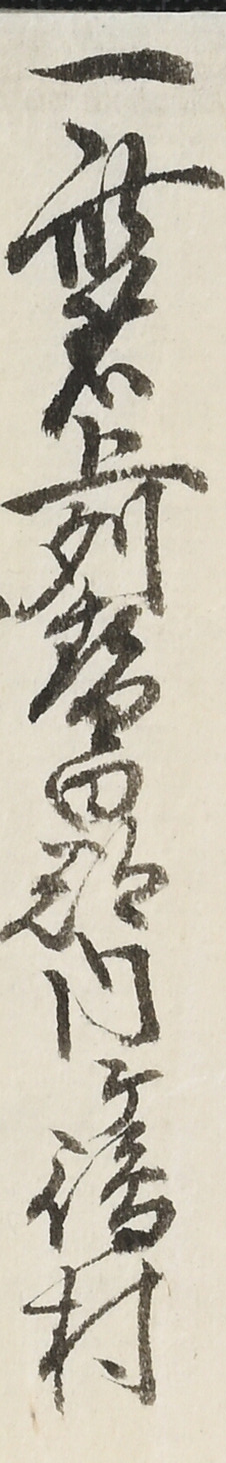一此者上州勢田郡内ヶ島村
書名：萬延二年辛取（酉）年正月他国石切名前書上帳
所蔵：伊那市立高遠町図書館・合同会社AMANE
